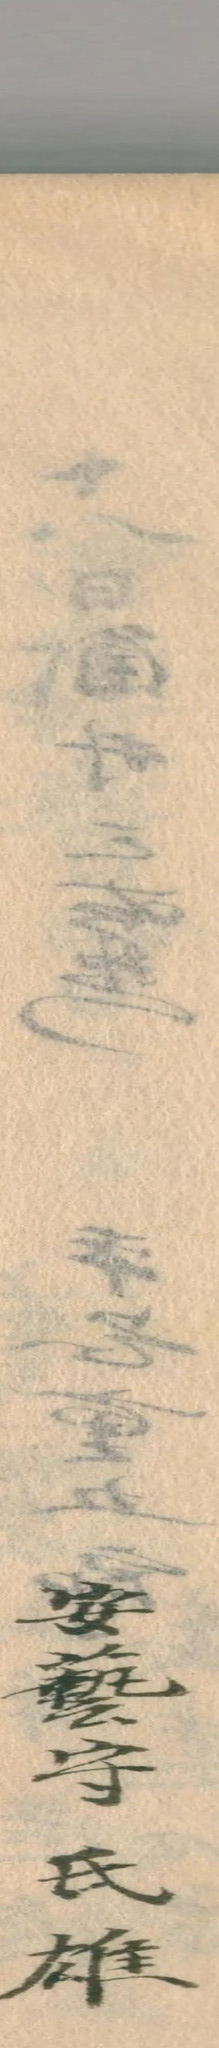安芸守氏雄
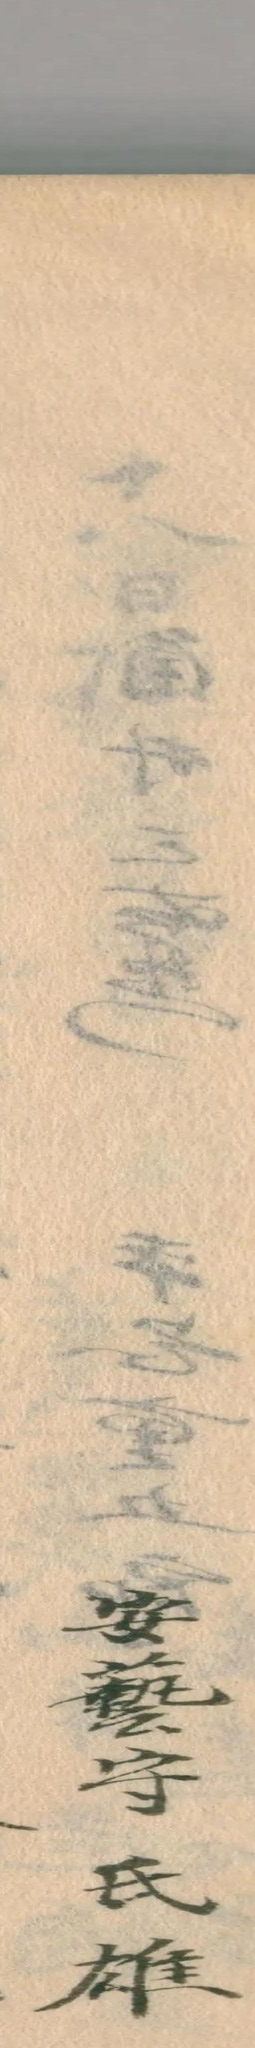安芸守氏雄
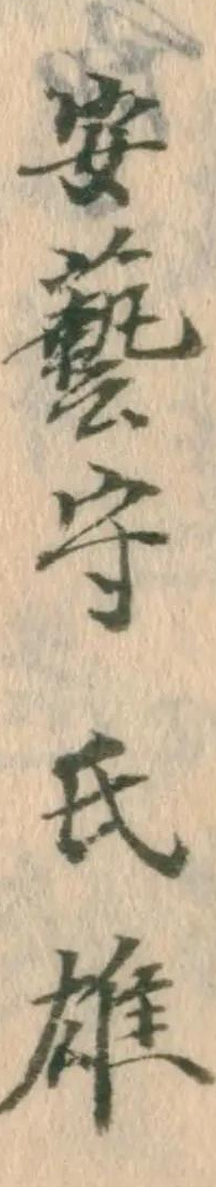安芸守氏雄
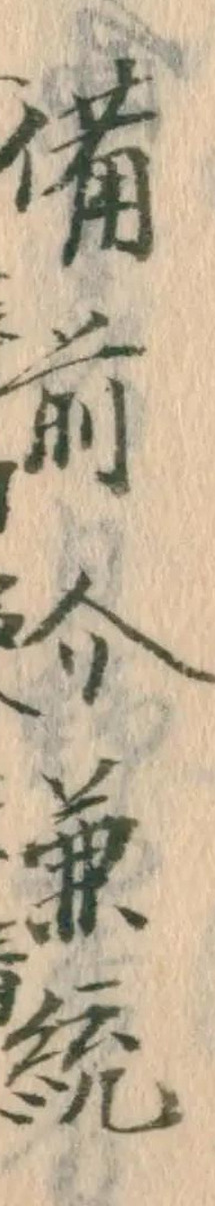備前介兼統
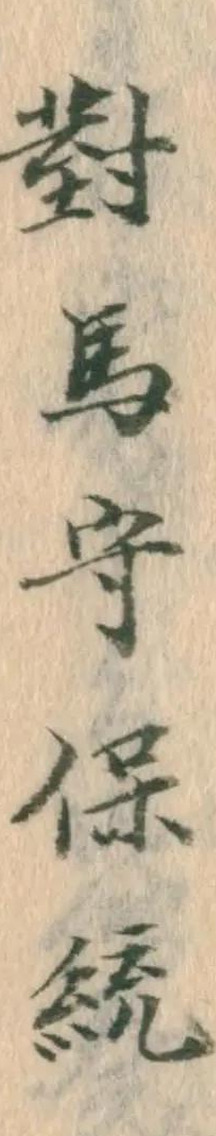対馬守保統
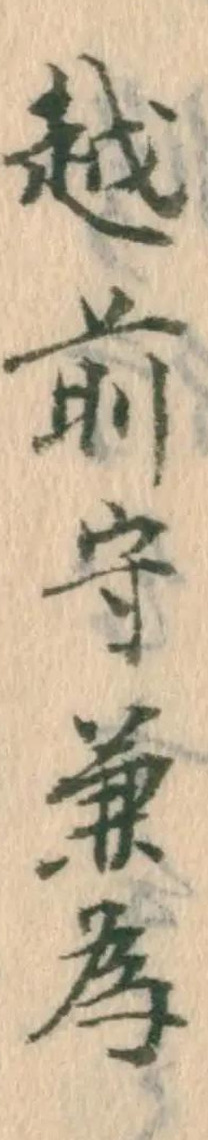越前守兼為
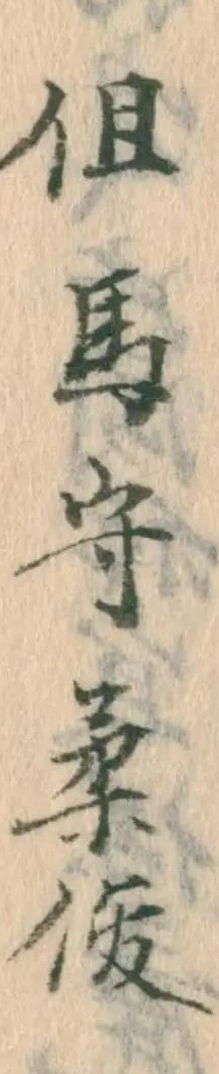但馬守柔俊
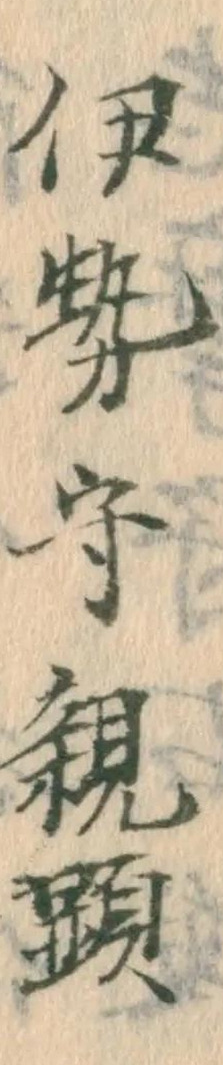伊勢守親顕
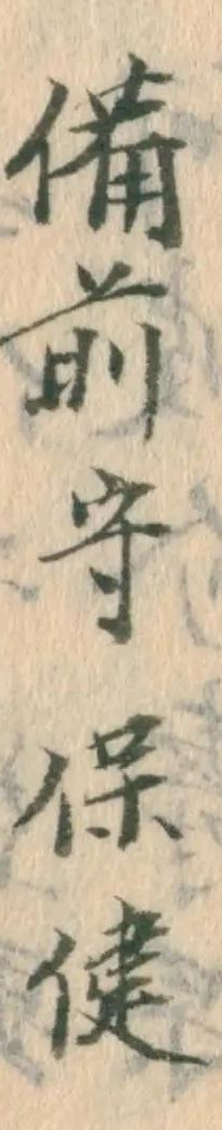備前守保健
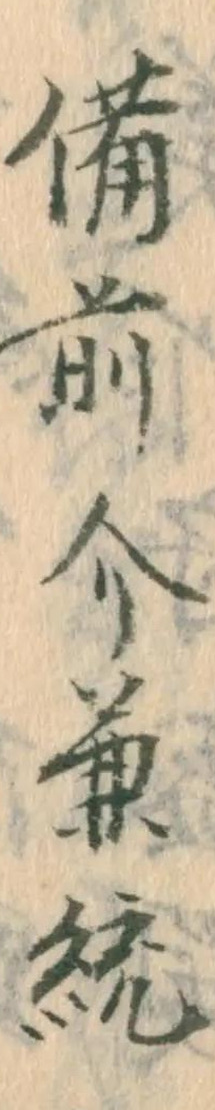備前介兼統
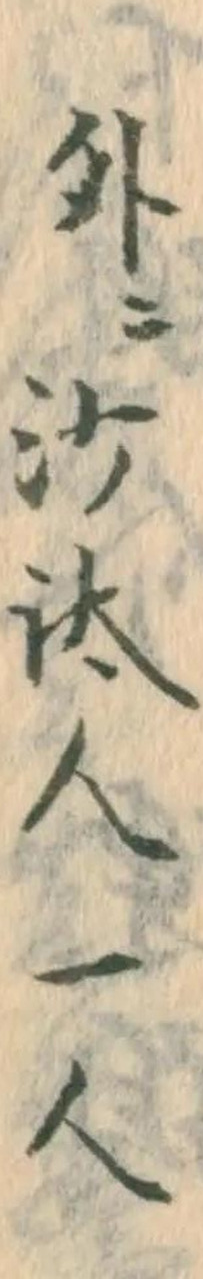外ニ沙汰人一人

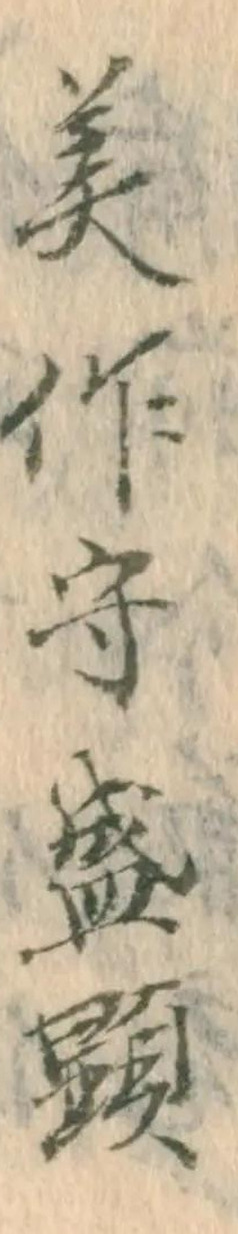美作守盛顕
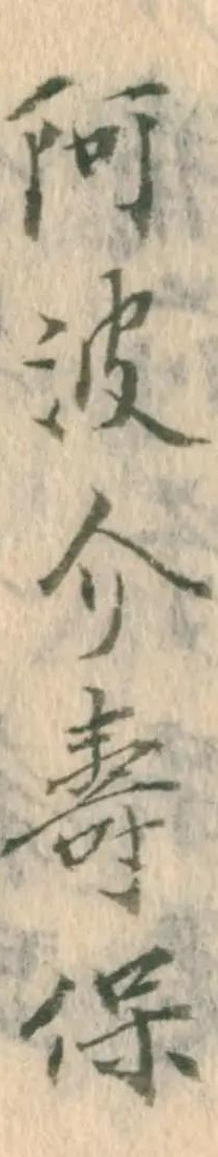阿波介寿保
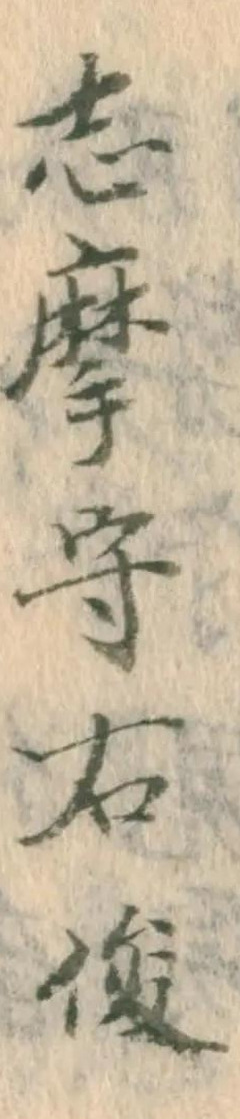志摩守右俊
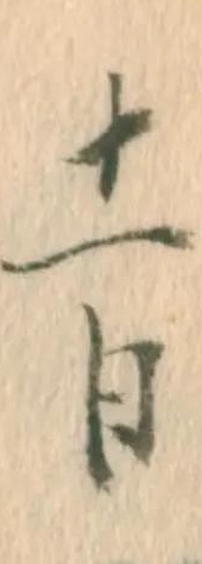十一日
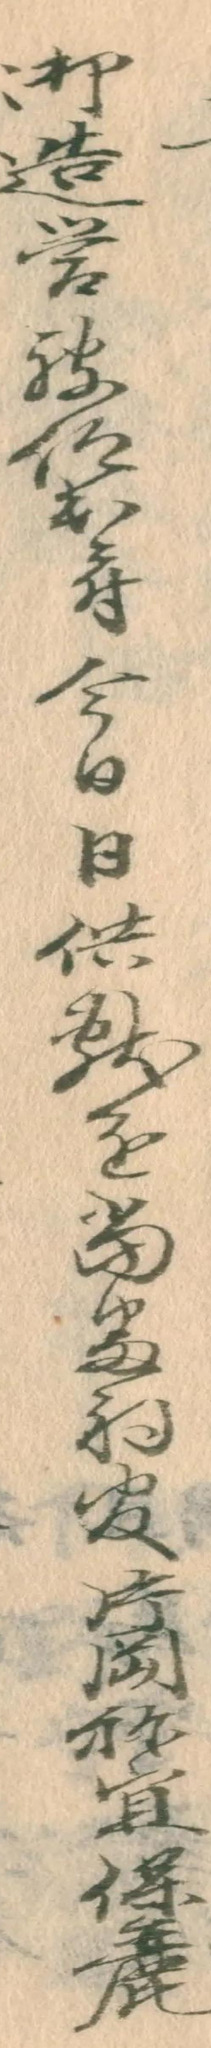一御造営被仰出ニ付今日日供献進当番祠官片岡祢宜保麗
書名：賀茂社記録. 第17冊
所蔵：国立国会図書館 National Diet Library, JAPAN
